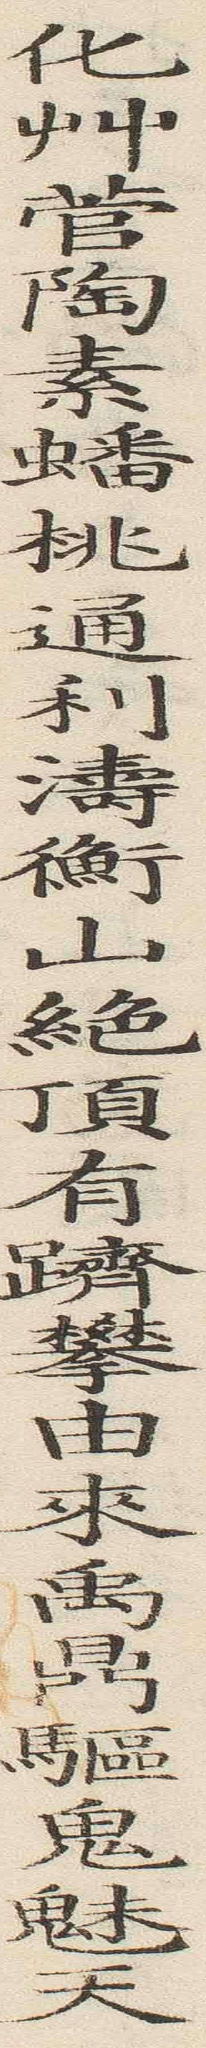化艸菅陶素蟠桃通利濤衡山絶頂有躋攀由來禹𪔂驅鬼魅天
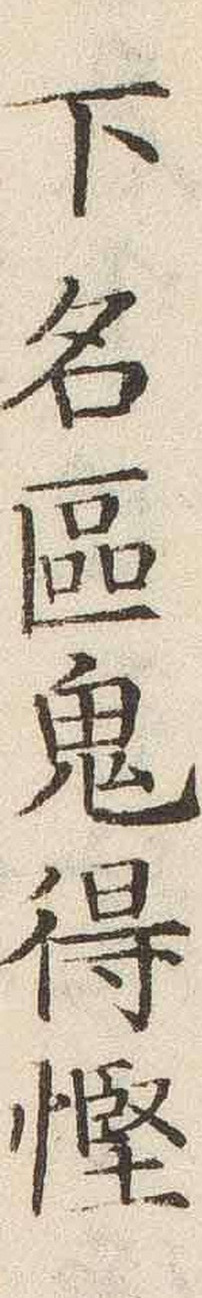下名區鬼得慳
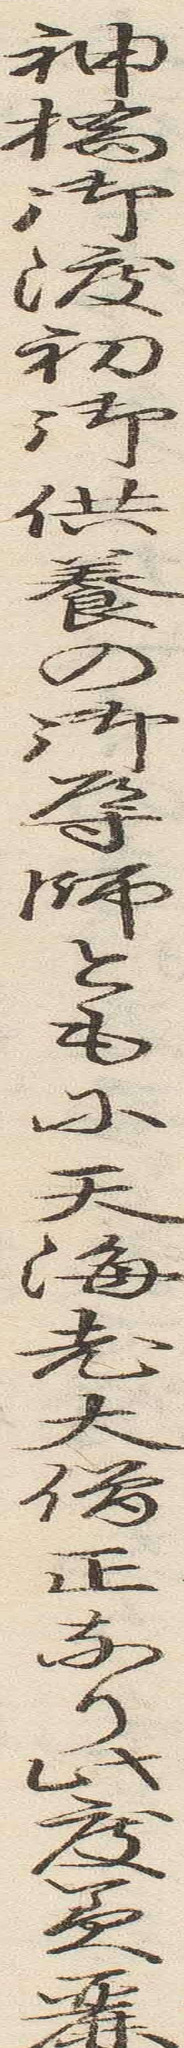神橋御渡初御供養の御導師ともに天海老大僧正なり此度美麗
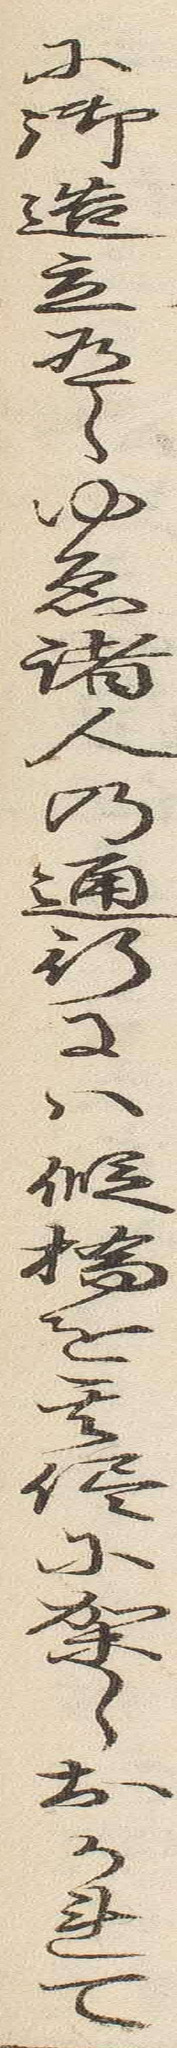に御造立有しゆゑ諸人の通行には假橋を其侭に架しおかれて
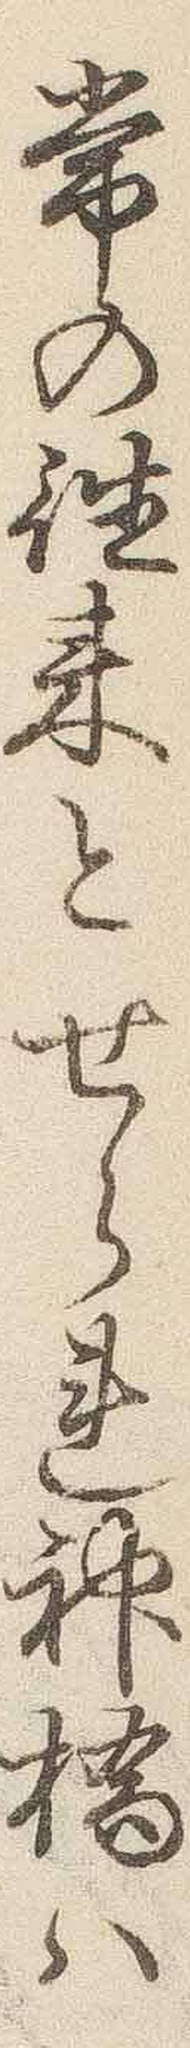常の徃来とせられ神橋は
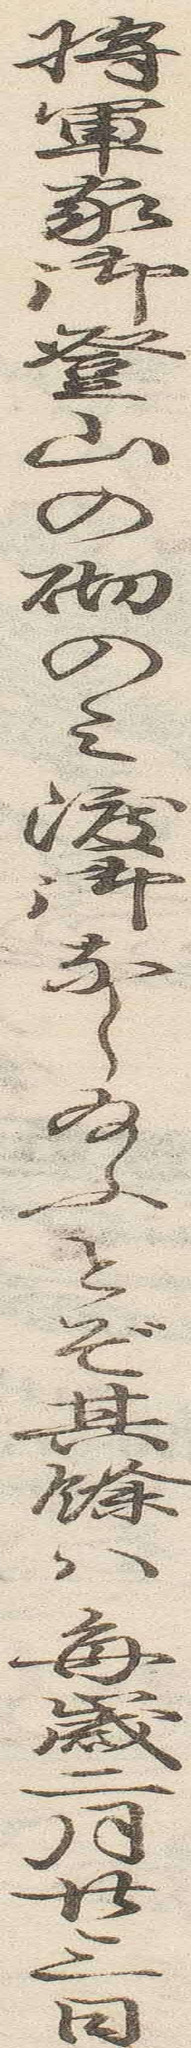将軍家御登山の砌のみ渡御なし給ふとぞ其餘は每歳二月廿三日
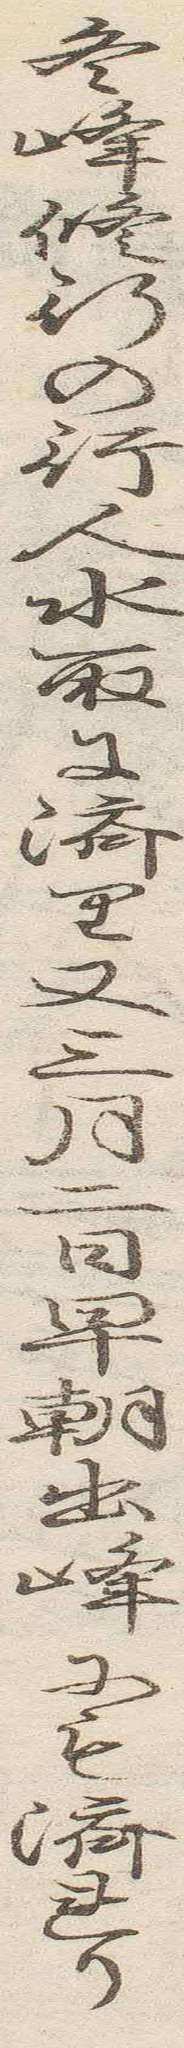冬峰修行の行人水取に済り又三月二日早朝出峰にも済れり
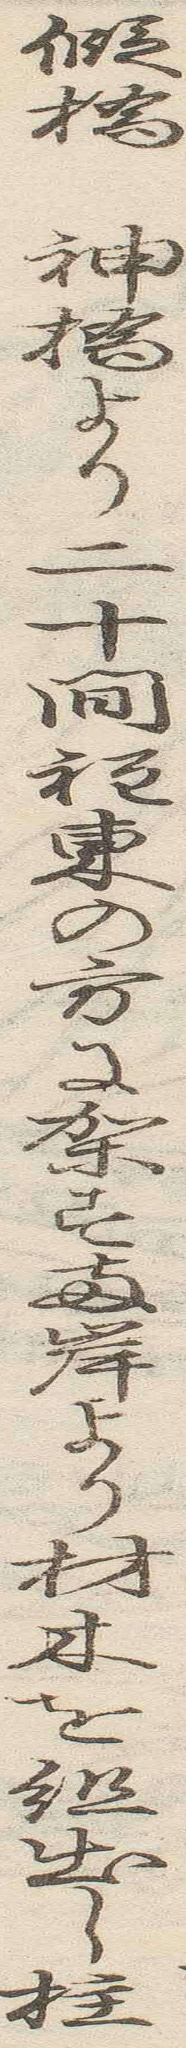假橋神橋より二十間程東の方に架す両岸より材木を組出し柱
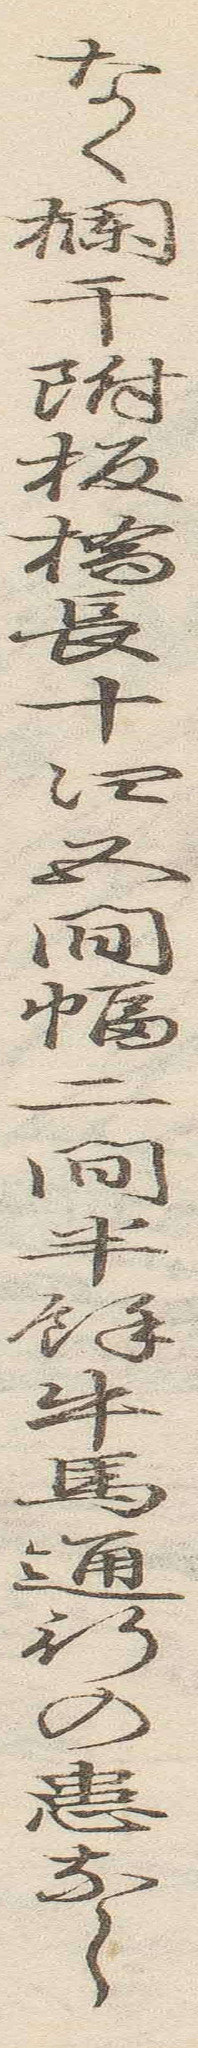なく欄干附板橋長十四五間幅二間半餘牛馬通行の患なし
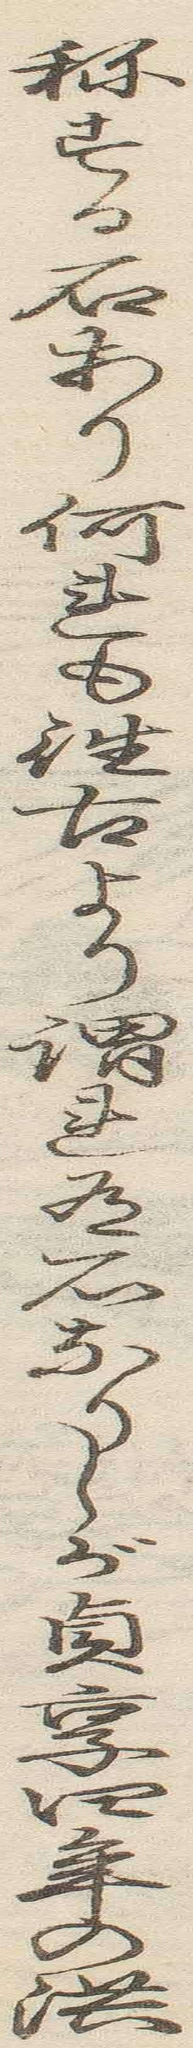称する石あり何れも徃古より謂れ有石なりしが貞享四年の洪
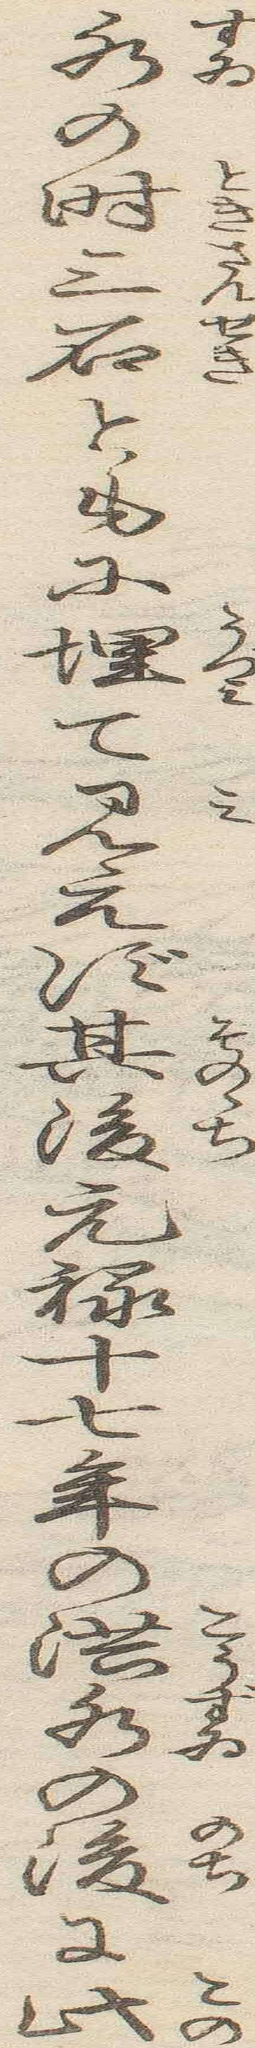水の时三石ともに埋て見えず其後元祿十七年の洪水の後に此
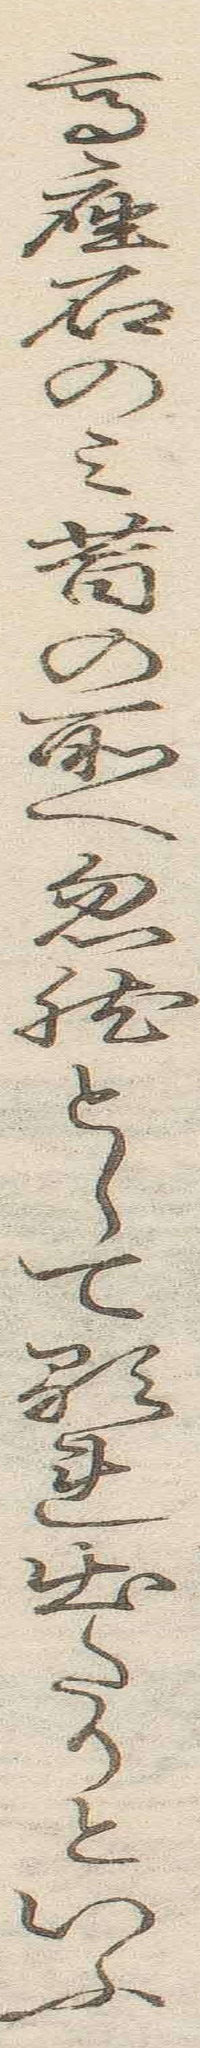高座石のみ昔の所へ忽然として顕れ出たりといふ
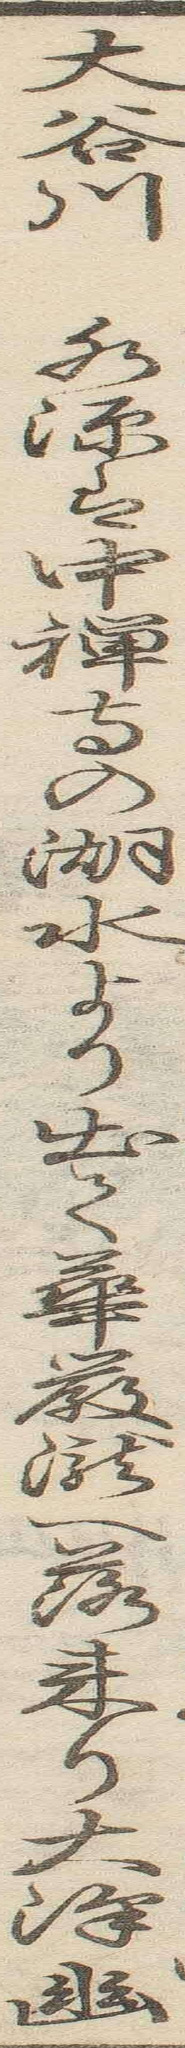大谷川水源は中禅寺の湖水より出て華厳瀧へ落来り大澤幽
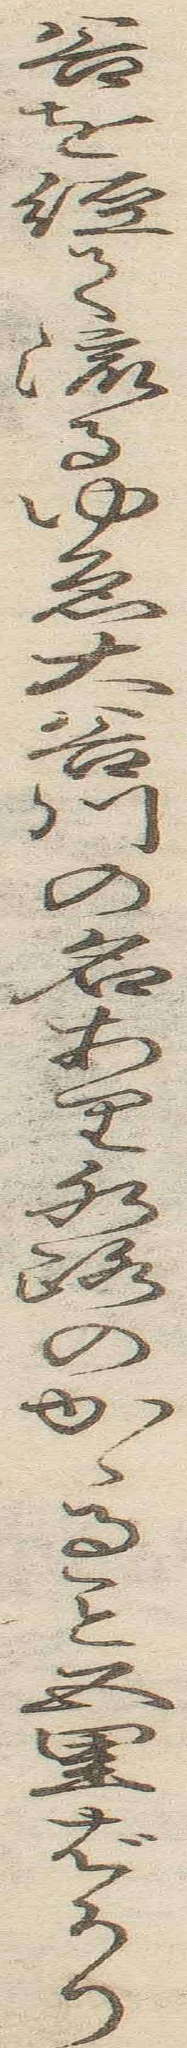谷を經て流るゆゑ大谷川の名あり水路のかゝること五里ばかり
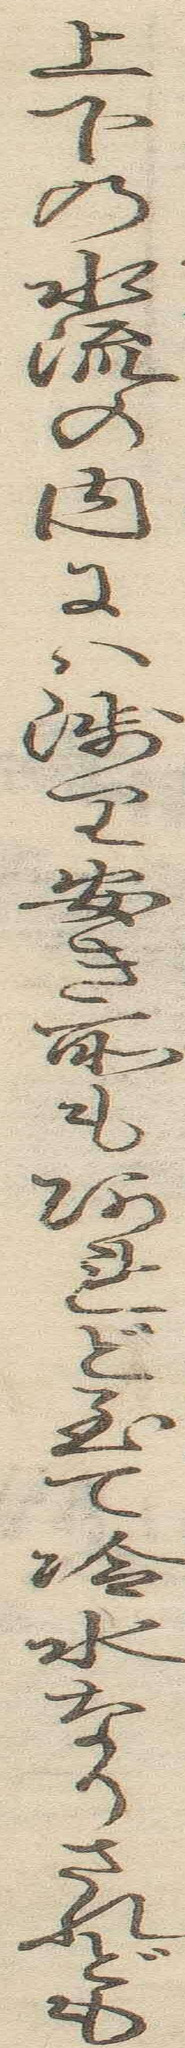上下の水流の内には渉り安き所もあれど至て冷水なりされども

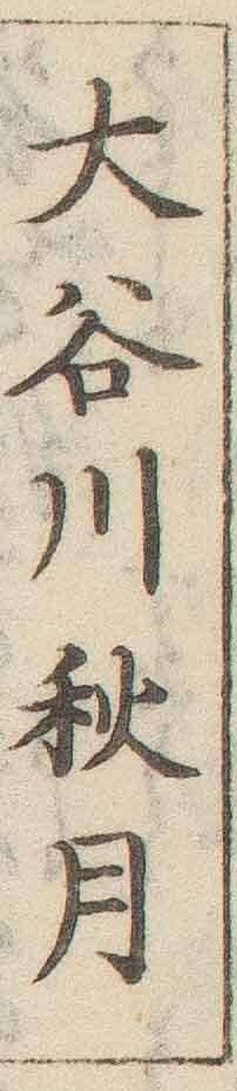大谷川秋月
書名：日光山志
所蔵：東京学芸大学附属図書館 国文学研究資料館
